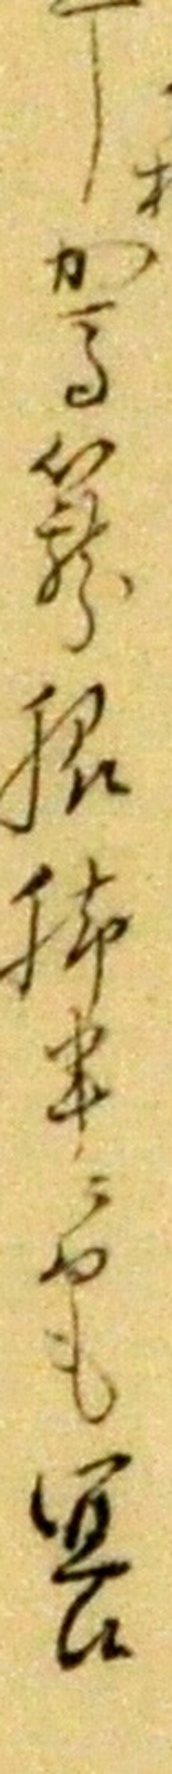下札駕籠脇脚絆に而も宜候
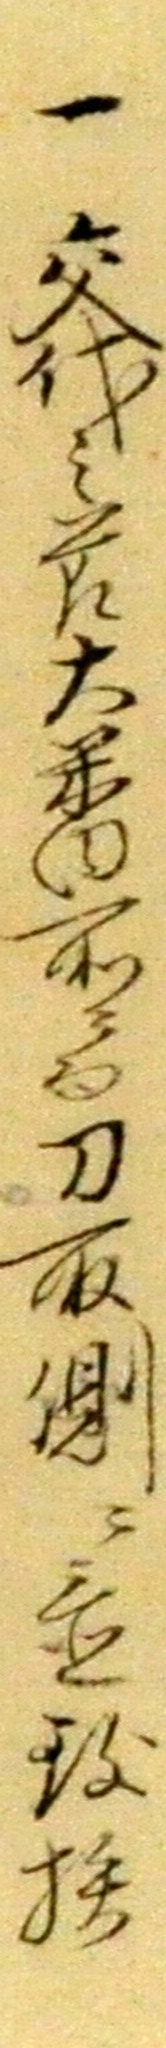一交代之節大番所に而刀取側に置致挨
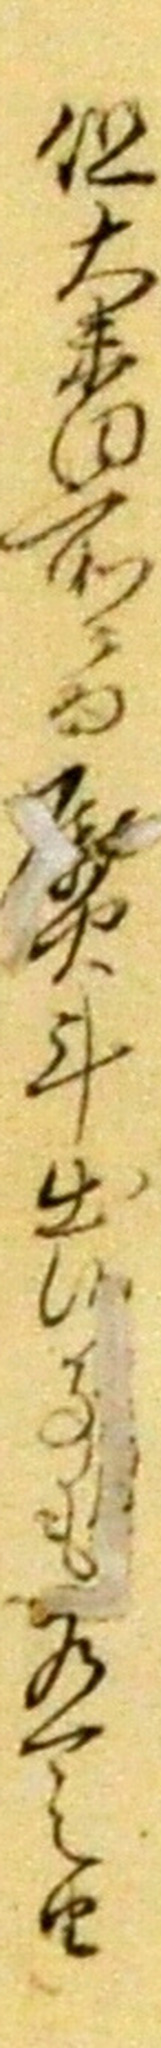但大番所に而熨斗出候事も有之由
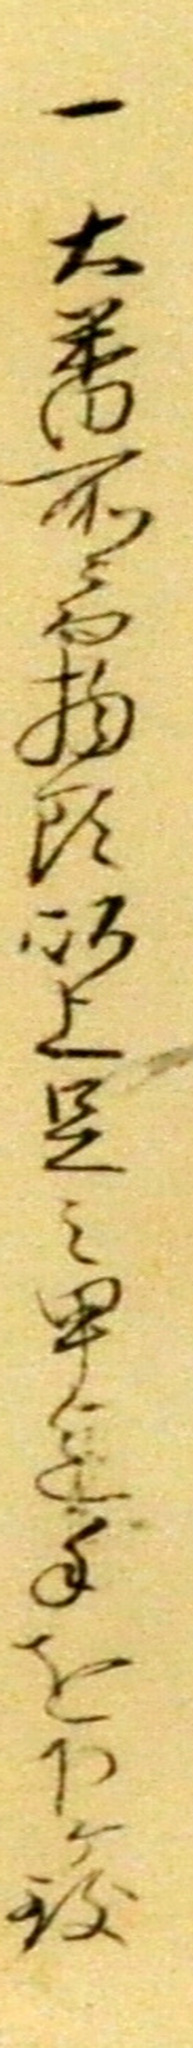一大番所に而物頭以上足之甲迄手を下ケ致
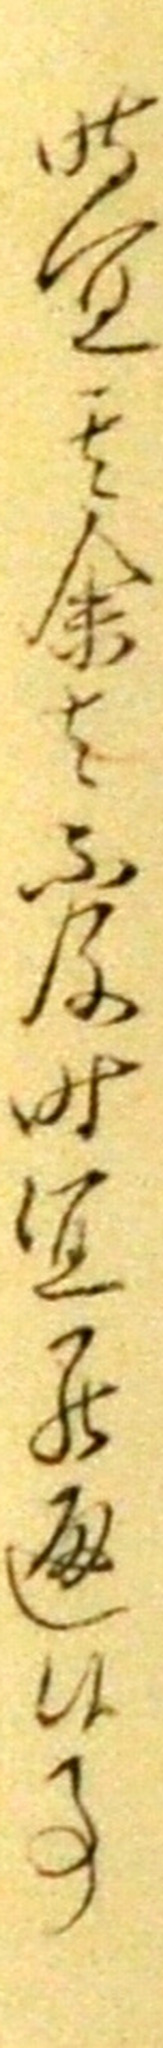時宜其余は不及時宜罷通候事

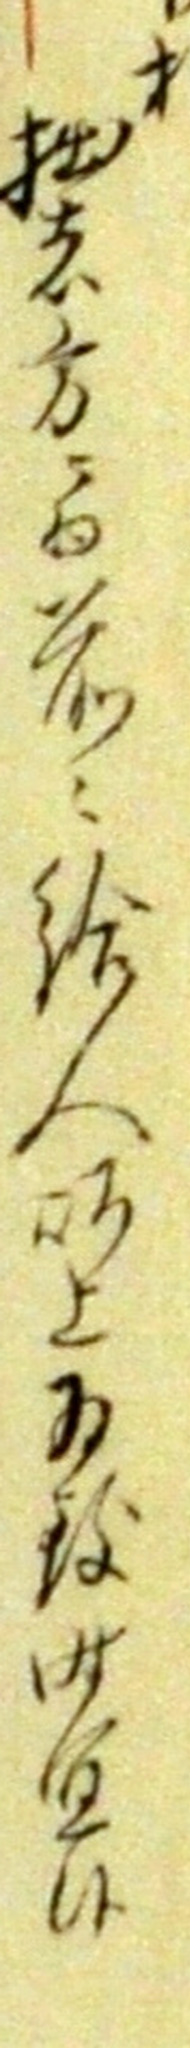下札拙者方に而前々給人以上為致時宜候
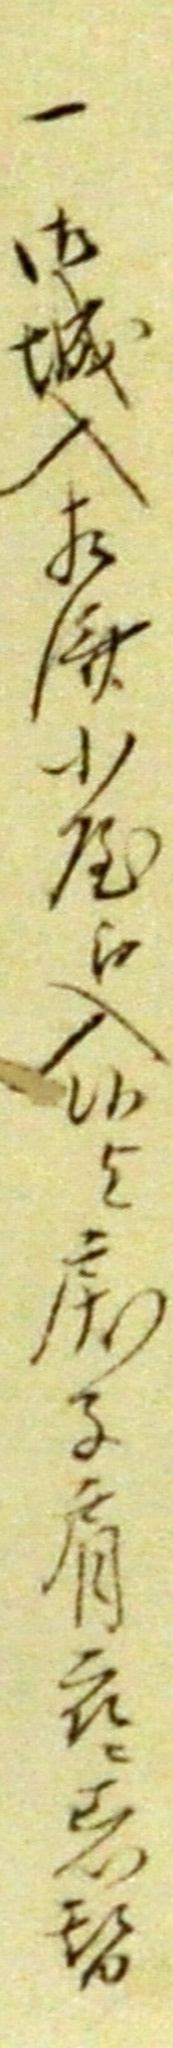一御城入相済小屋え入候は戻子肩衣に着替
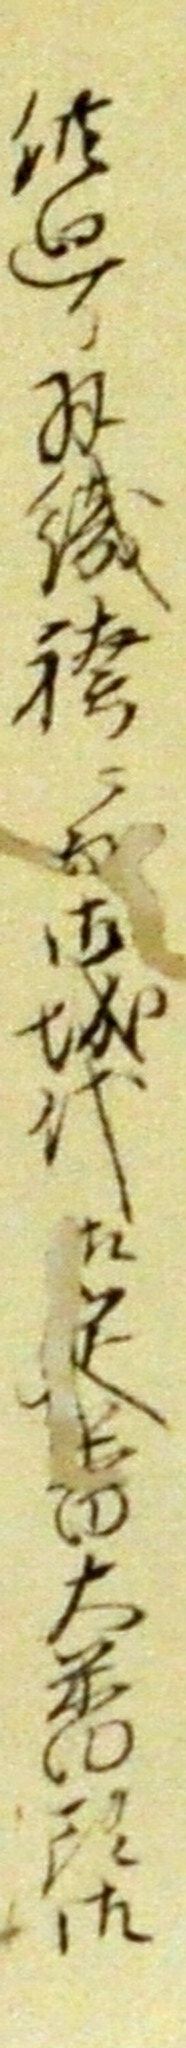供廻り羽織袴に而御城代御定番大番頭御
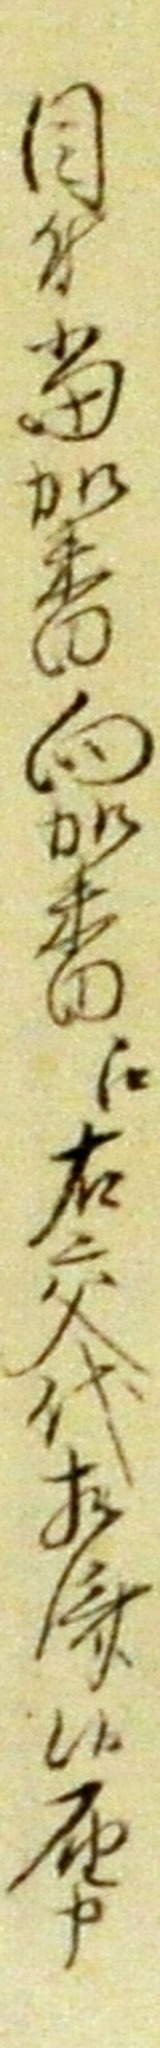目付当加番向加番え右交代相済候届申
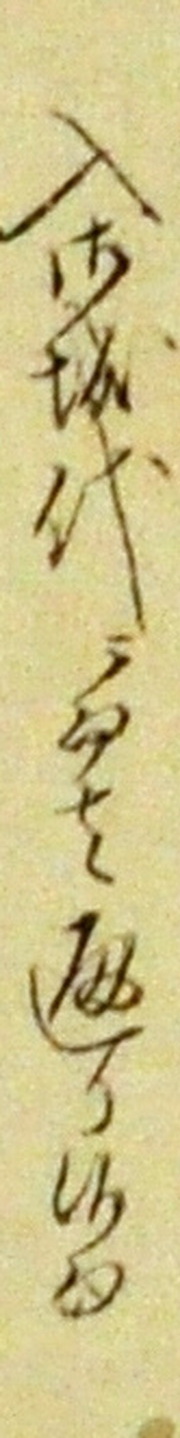入御城代に而は通り候而
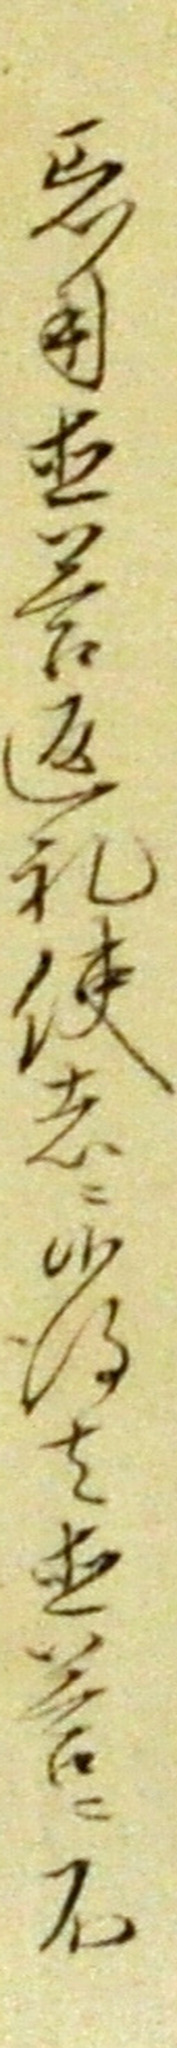着用直答返礼使者に候得は直答に不
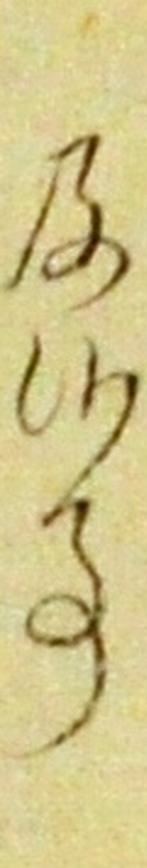及候事
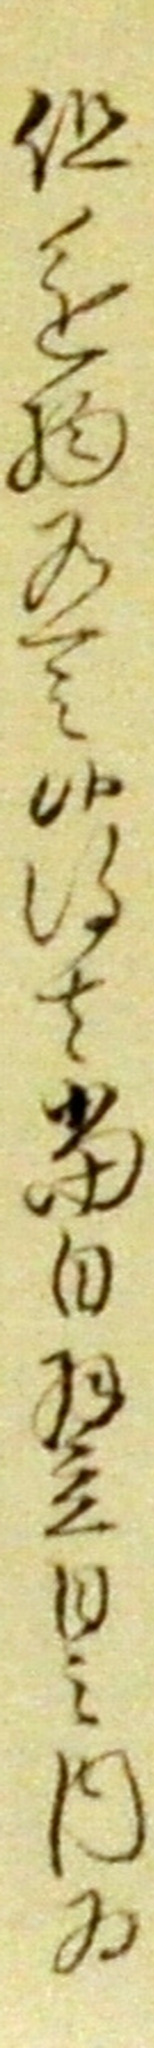但進物有之候得は当日翌日之内為
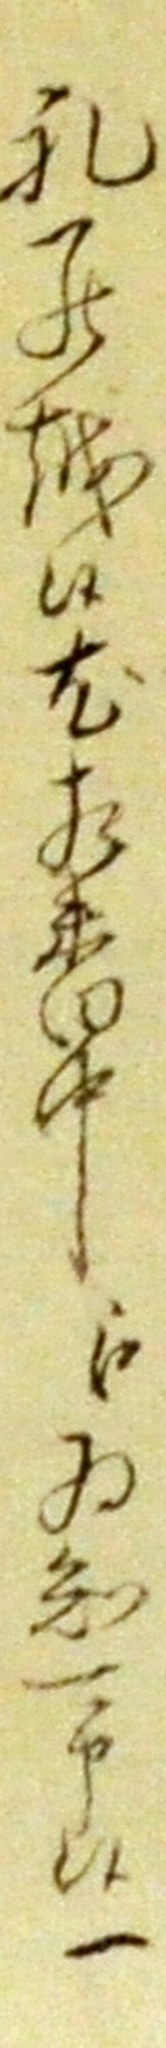礼罷越候尤相番中え為知可申候一
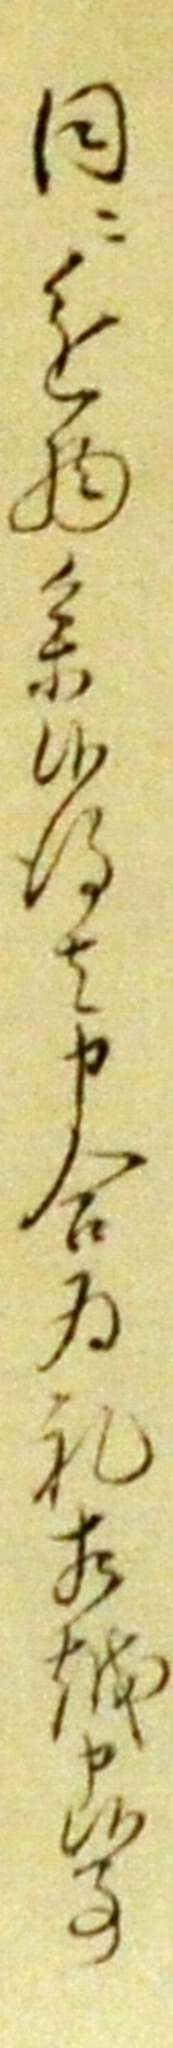同に進物参候得は申合為礼相越申候事
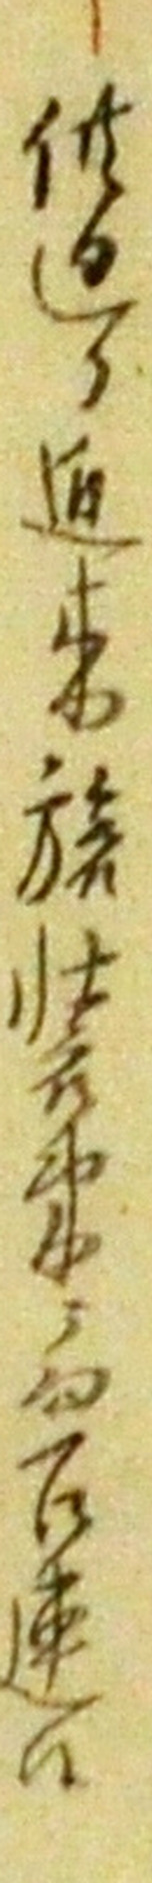下札供廻り近来旅装束に而召連候
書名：大阪加番関係諸書留〔一括〕
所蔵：伊那市立高遠町図書館・合同会社AMANE
